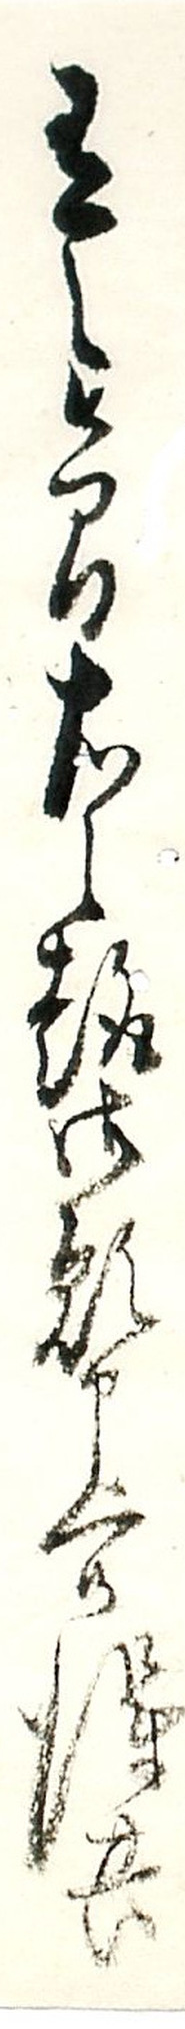有之候間右之趣御願申上候得共
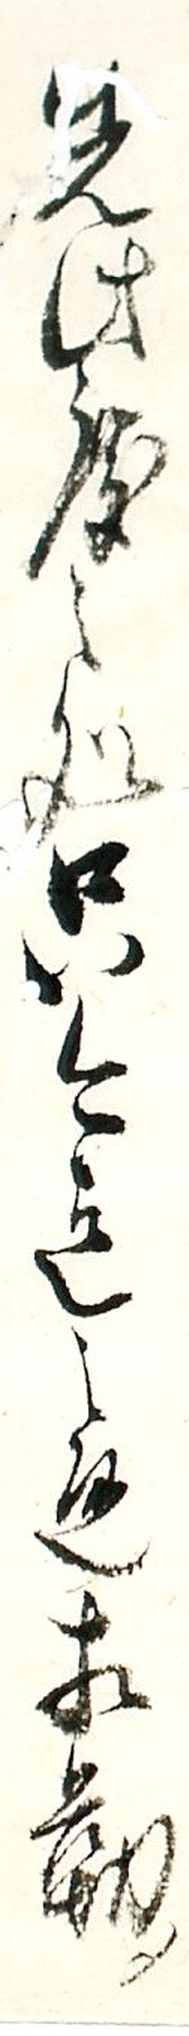先此度之処只今迄之通相勤め
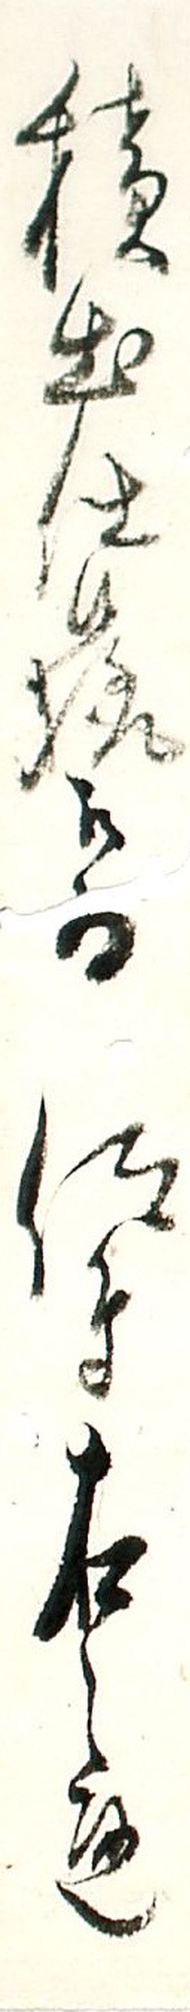積出仕候様被為仰付右之通
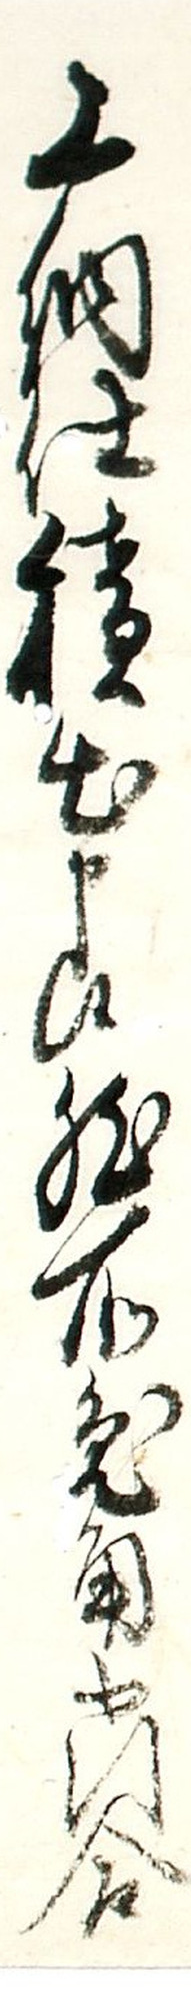上納仕積出申候然所兎角不引合
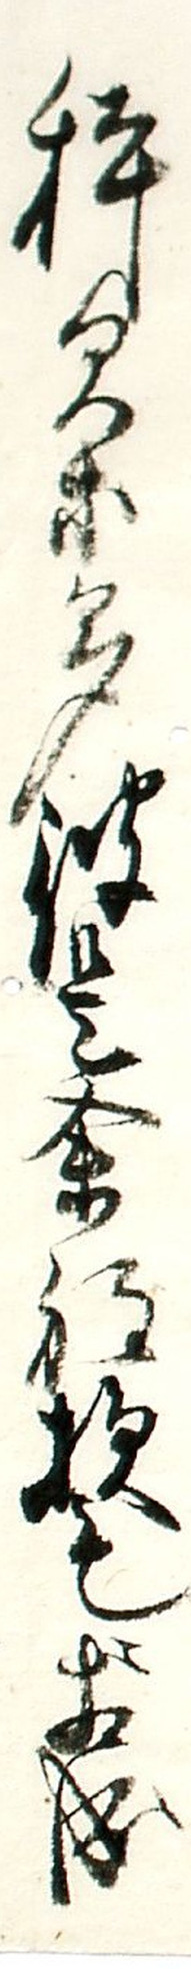秤欠等多彼是余程損毛に相成
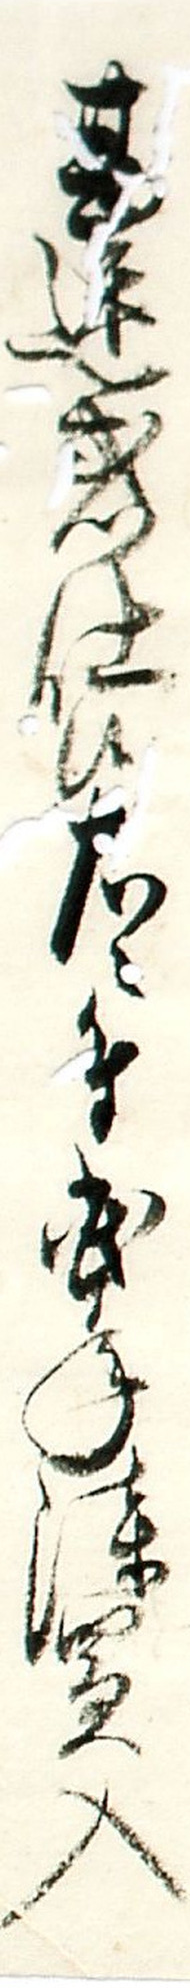甚迷惑仕候右に付当年漆買入
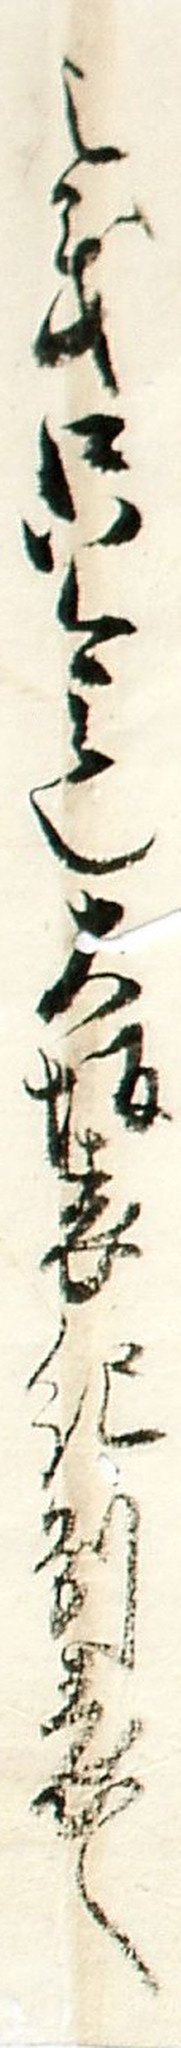之義只今迄大坂表紀州表へ
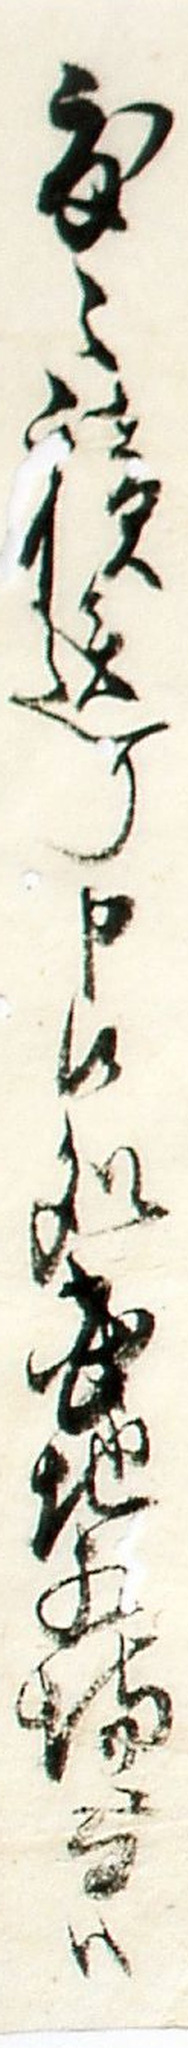度々積送り申候処当地相場に而は
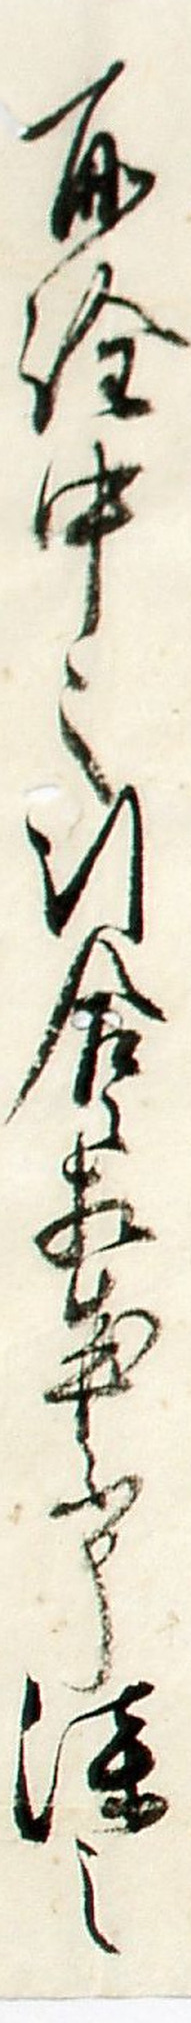所詮中々引合に相成不申漆之
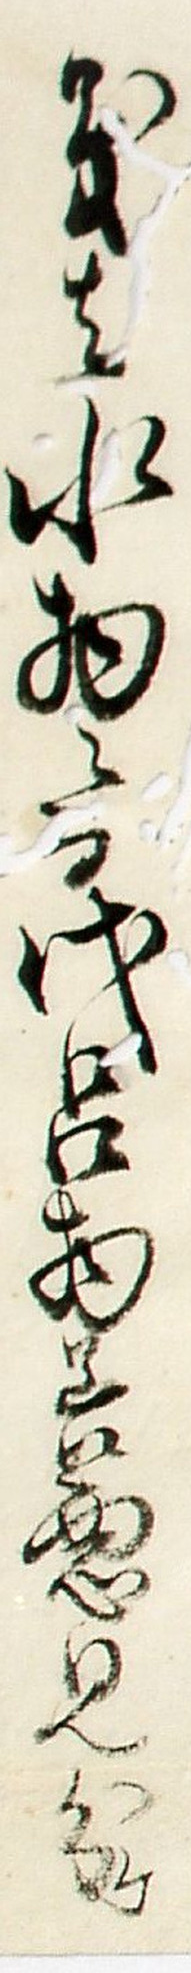義は水物に而代呂物善悪見分け

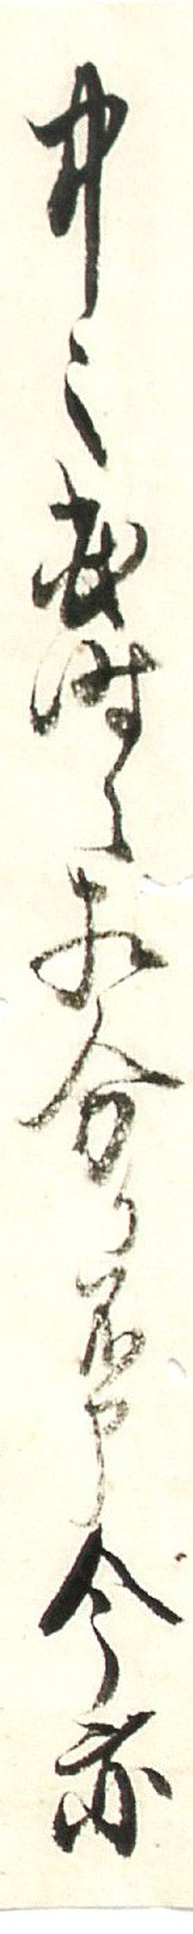中々当時に相分り不申今亦
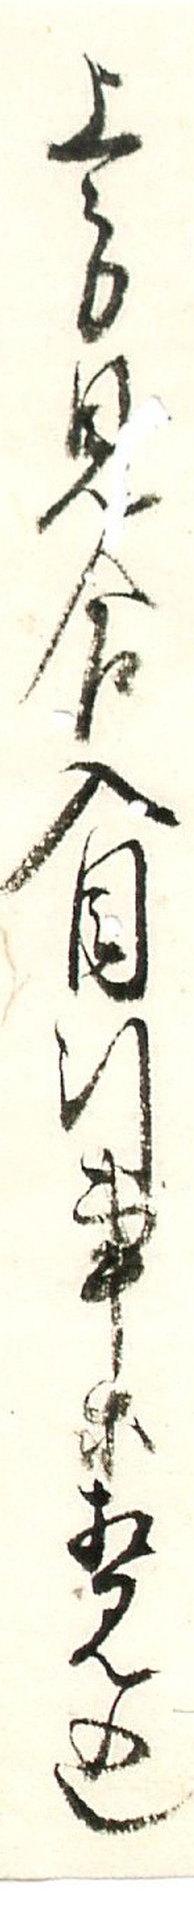上方見合入目引事等相見込
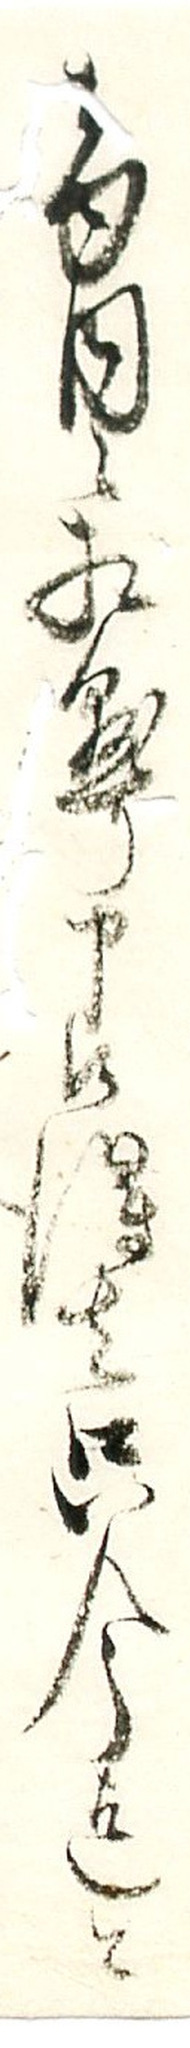商内に相懸り申候得は只今迄と
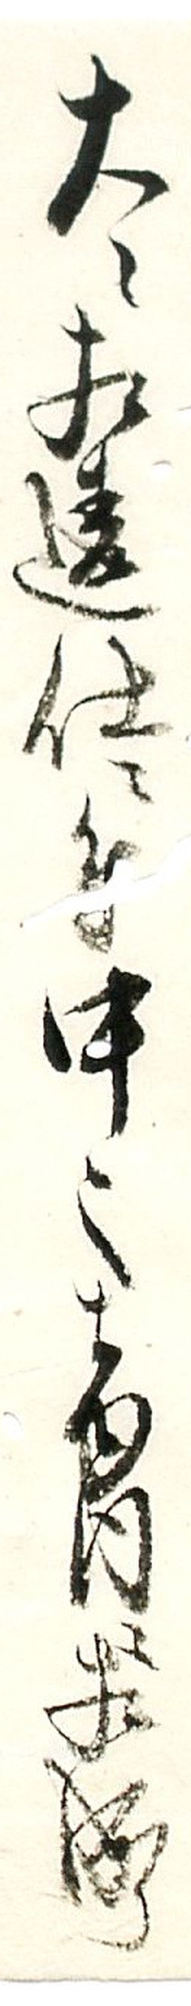大に相違仕に付中々商内ニ相成り
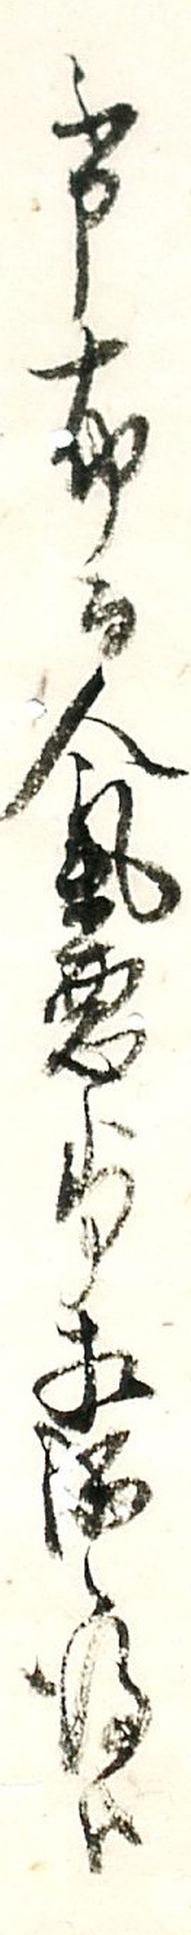不申却而人気悪布相成候得は
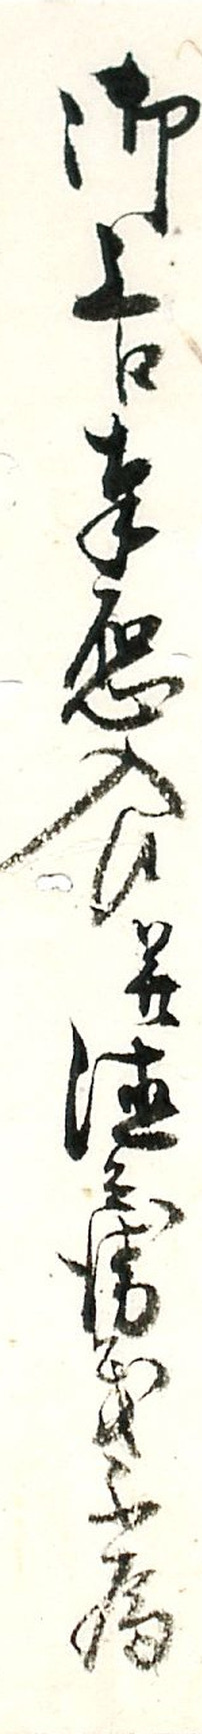御上え奉恐入候幷徳兵衛義不為
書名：乍恐横切ヲ以奉申上覚（山城谷漆買入銀一件ニ付）
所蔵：鳴門教育大学 Naruto University of Education
